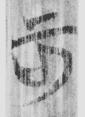可
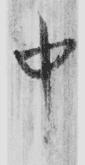中
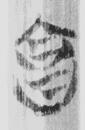合
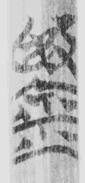鋻
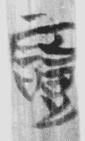{石疐}
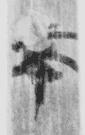不
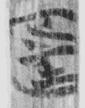{匚之𡈼}
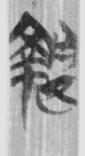執
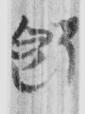即
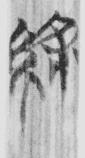{糸豕}
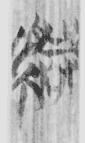{糸興}
